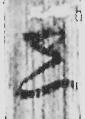已
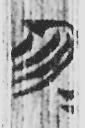勿=
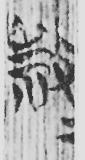殺=
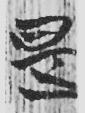是
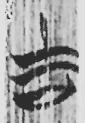吉
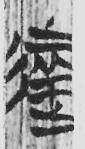{辶止㚔}（失）
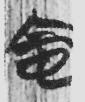{宀𠁩}（仲）
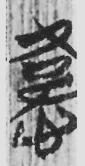{韋心}
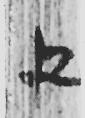卜
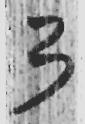乃
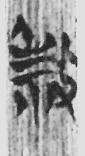殺
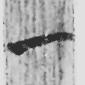一
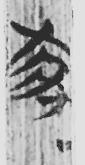豕
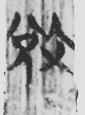敓（說）
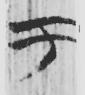于
